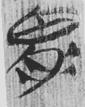{胃刀}（謂）
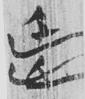○（仁）
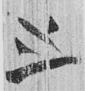之
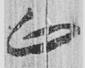㠯（以）
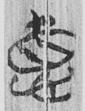惪（德）
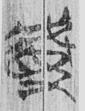○（且）
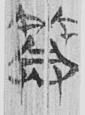○（管）
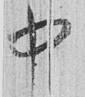仲
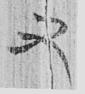又（有）
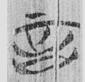言
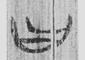曰
